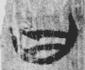曰
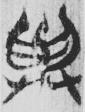與
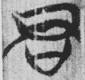君
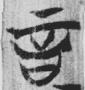言
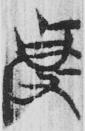○（使）
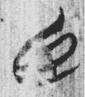臣
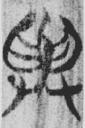與
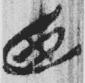臣
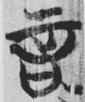言
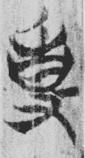事
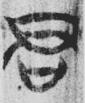君
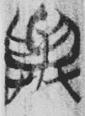與
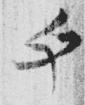父
